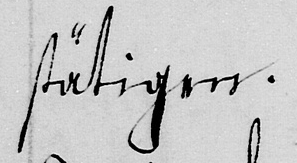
stätigen.
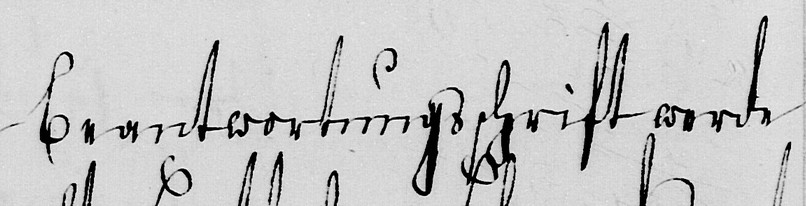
Beantwortungsschrift werde
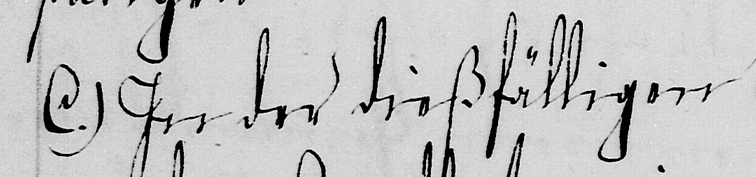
C.) In der dießfälligen
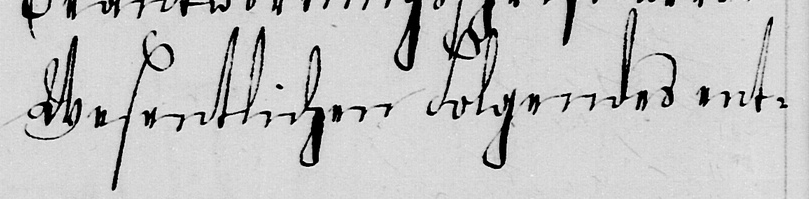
Wesentlichen Folgendes ent¬
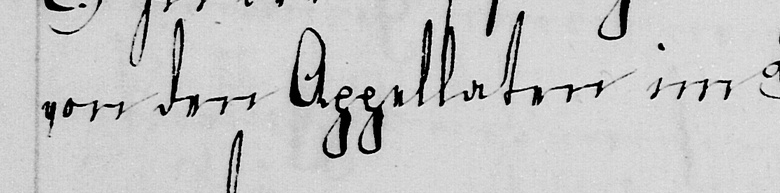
von den Appellaten im
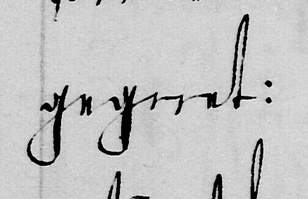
gegnet:
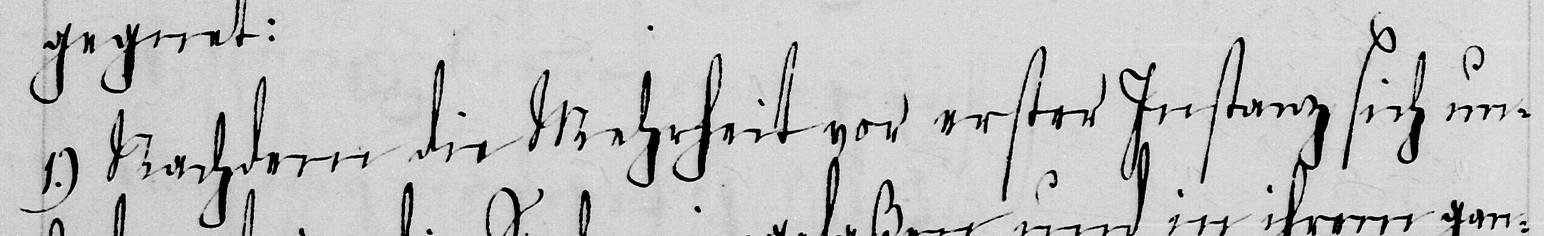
1.) Nachdem die Mehrheit vor erster Instanz sich un¬
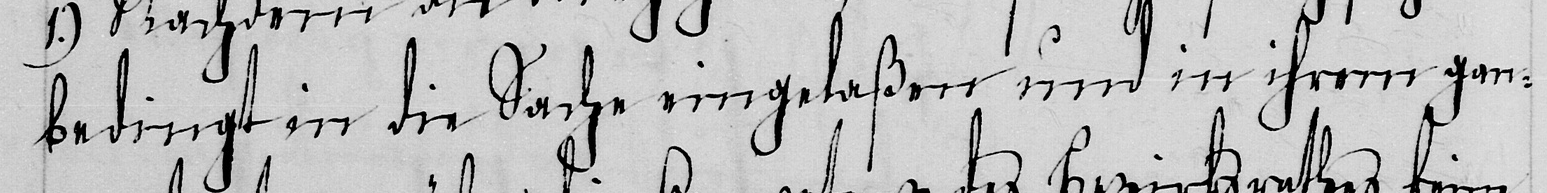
bedingt in die Sache eingelaßen und in ihrem gan¬
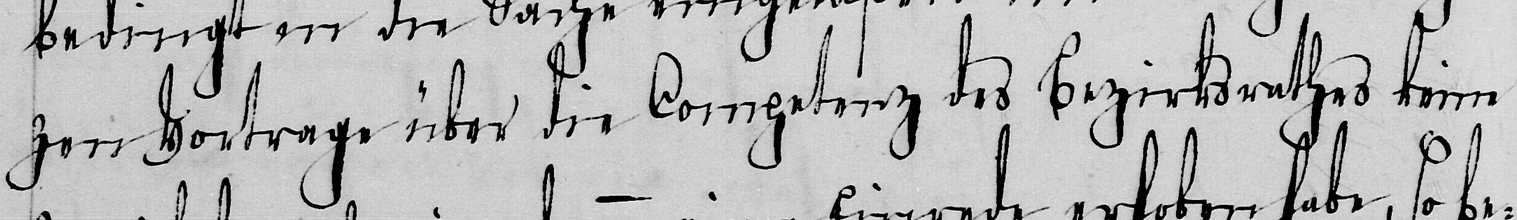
zen Vortrage über die Competenz des Bezirksrathes keine
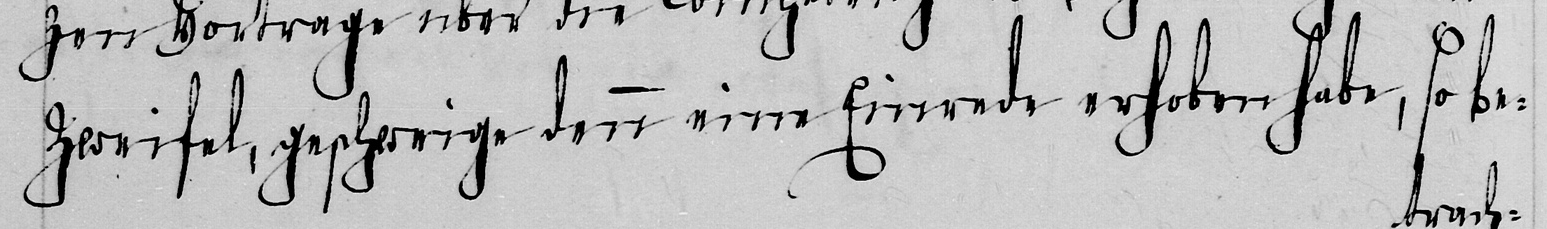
Zweifel, geschweige denn eine Einrede erhoben habe, so
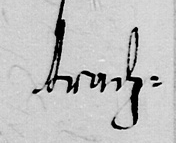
rch
